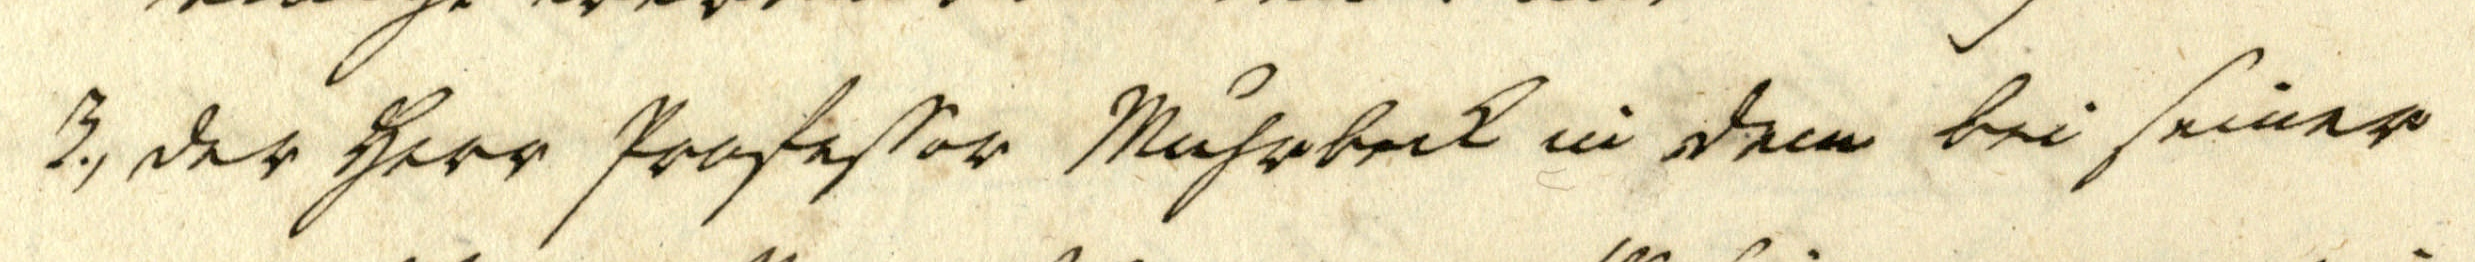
3., der Herr Professor Muhrbeck in dem bei seiner
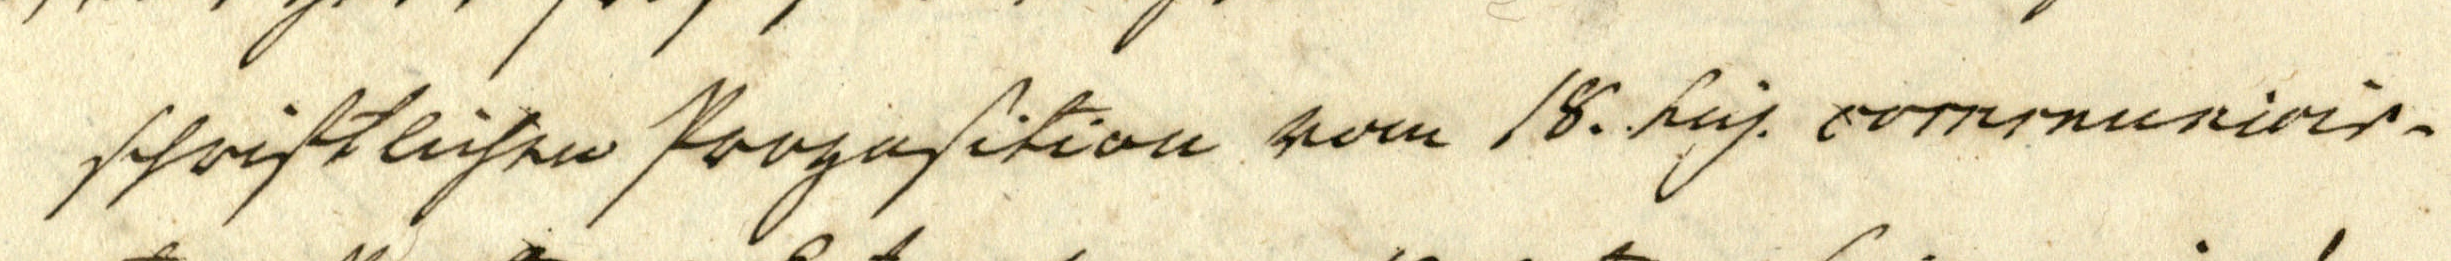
schriftlichen Proposition vom 18. huj. communicir¬
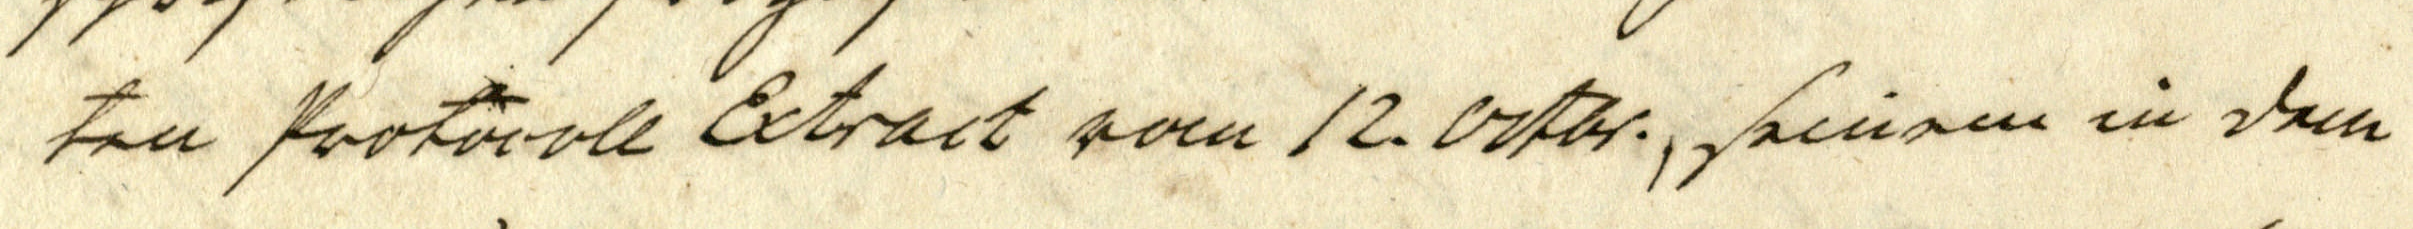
ten Protocoll Extract vom 12 Octbr., seinem in dem
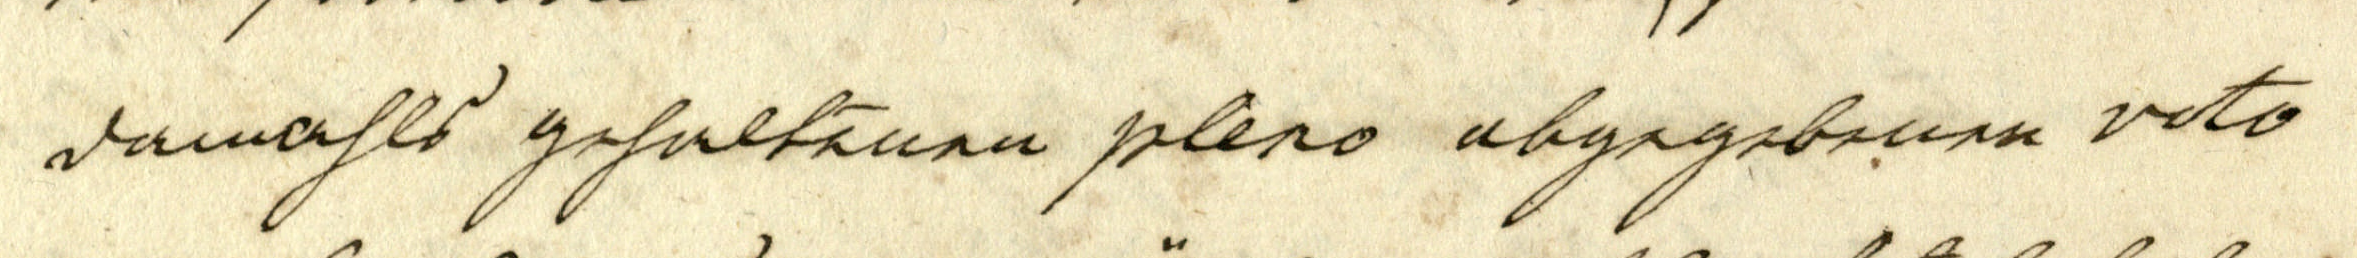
damahls gehaltenen pleno abgegebenen voto
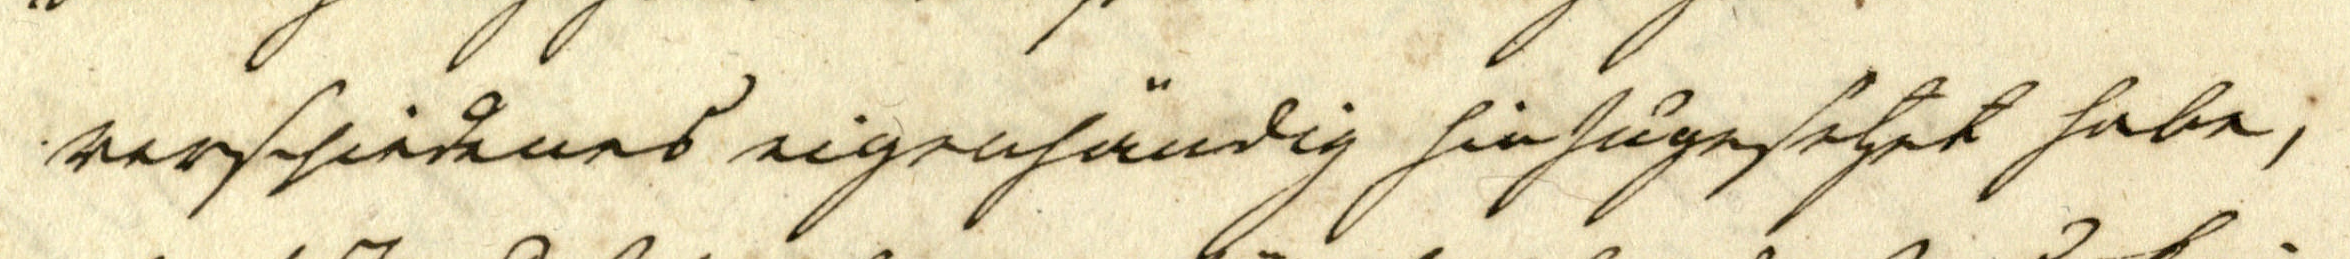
verschiedenes eigenhändig hinzugesetzet habe,
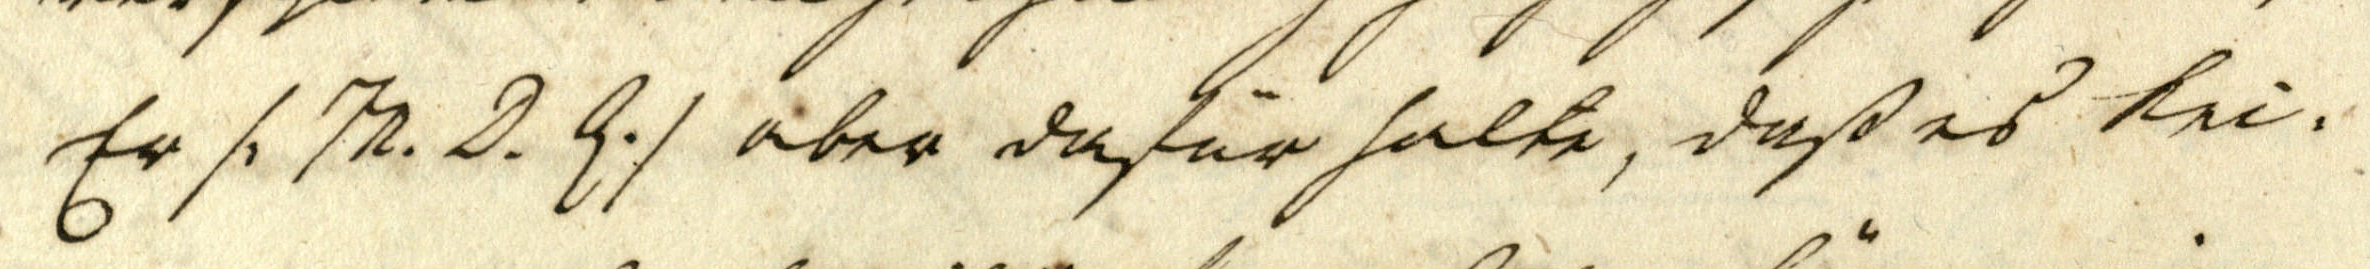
Er /: M. D. R./ aber dafür halte, daß es kei¬
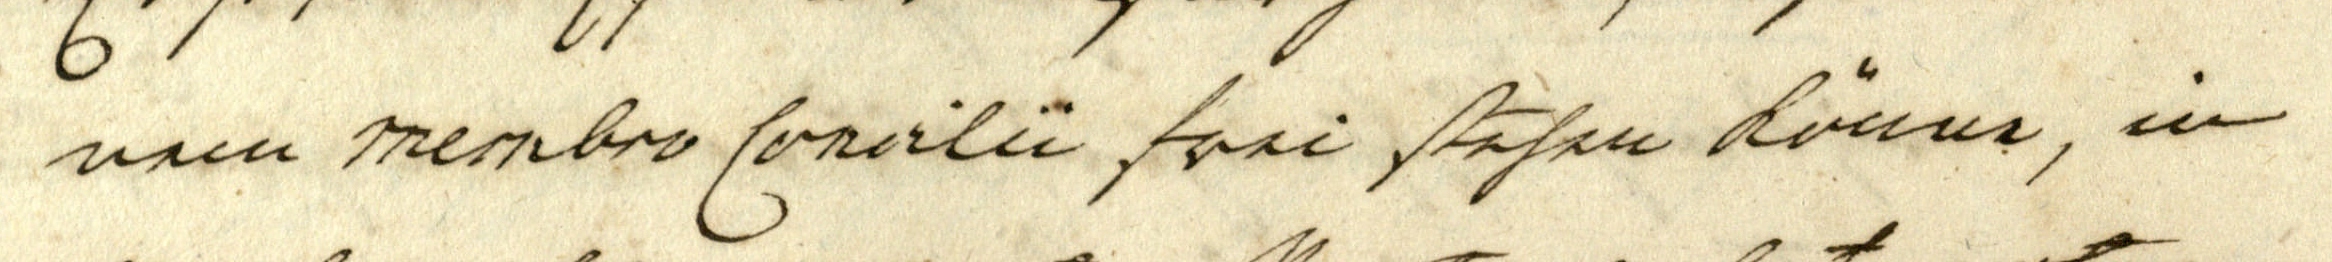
nem membro Concilii frei stehen könne, in
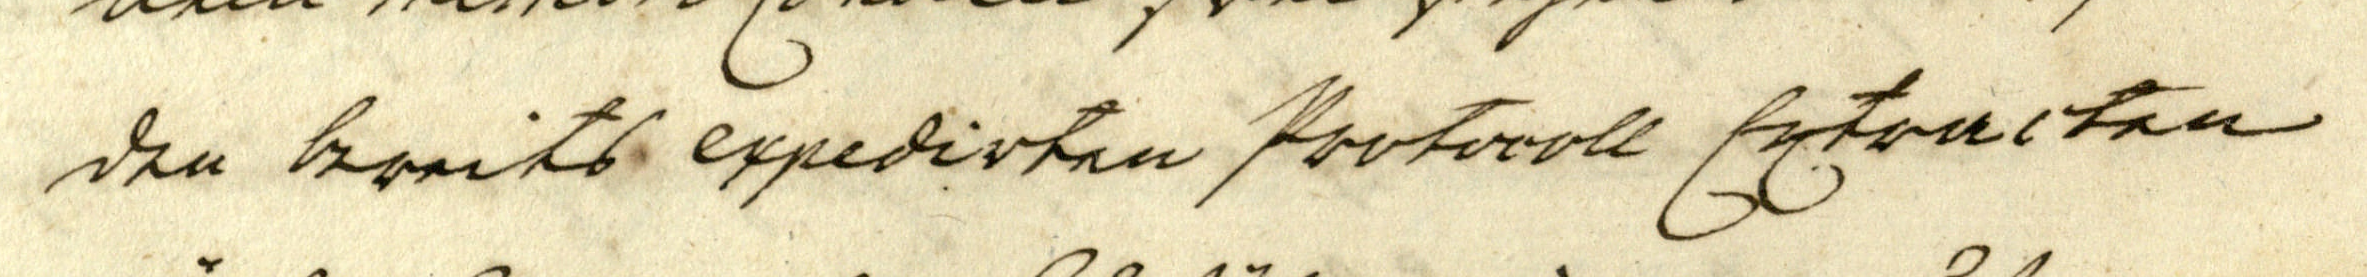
den bereits expedirten Protocoll Extracten
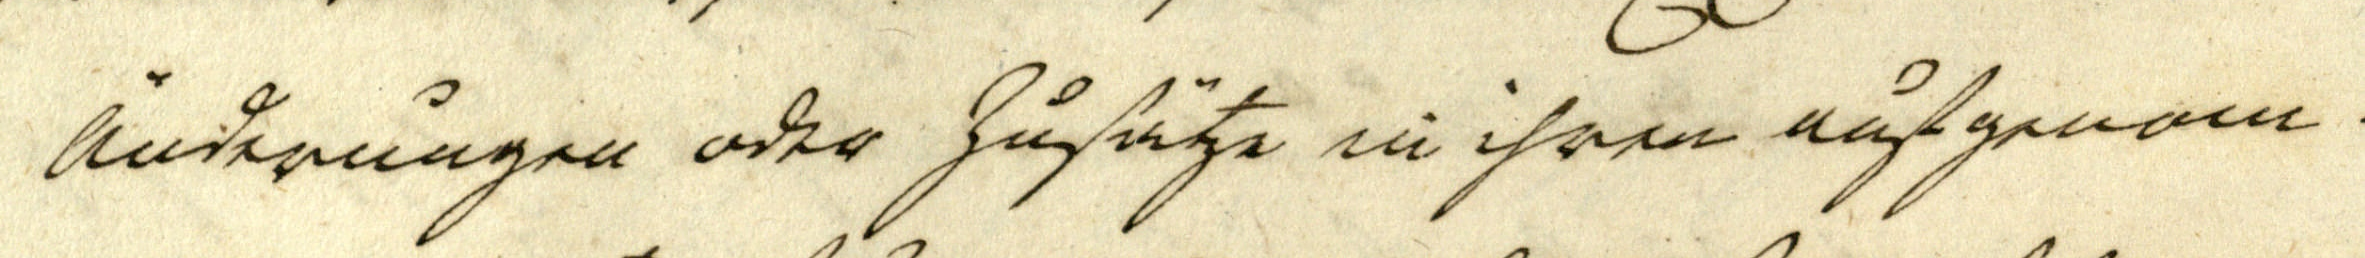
Änderungen oder Zusätze in ihren auf genom¬
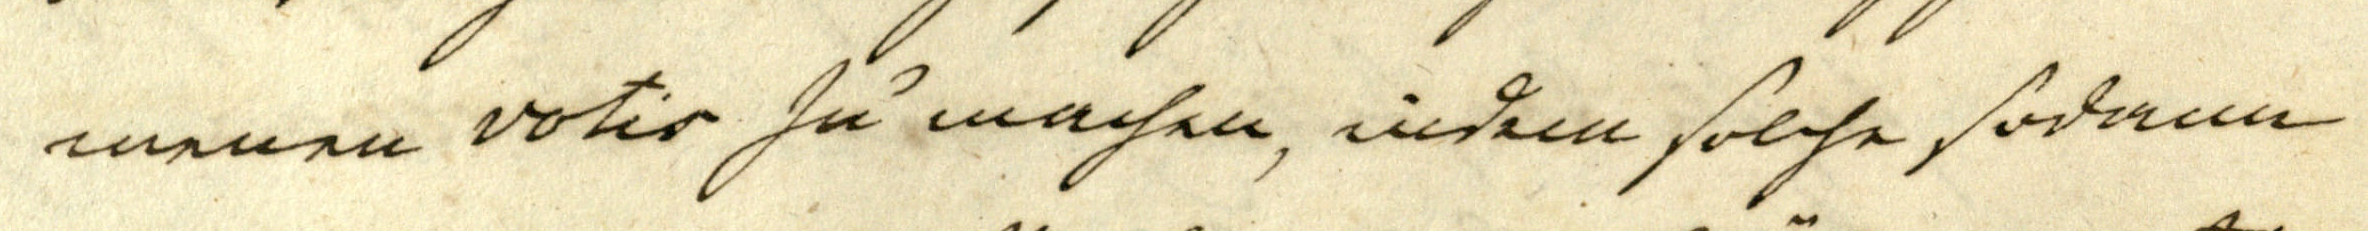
menen votis zu machen, indem solche sodann
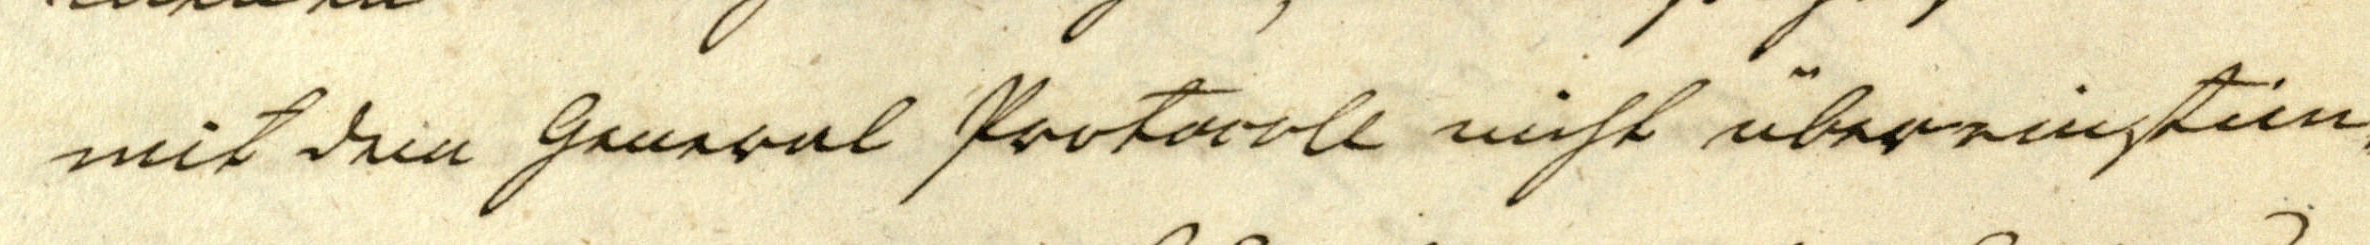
mit dem General Protocoll nicht übereinstim¬
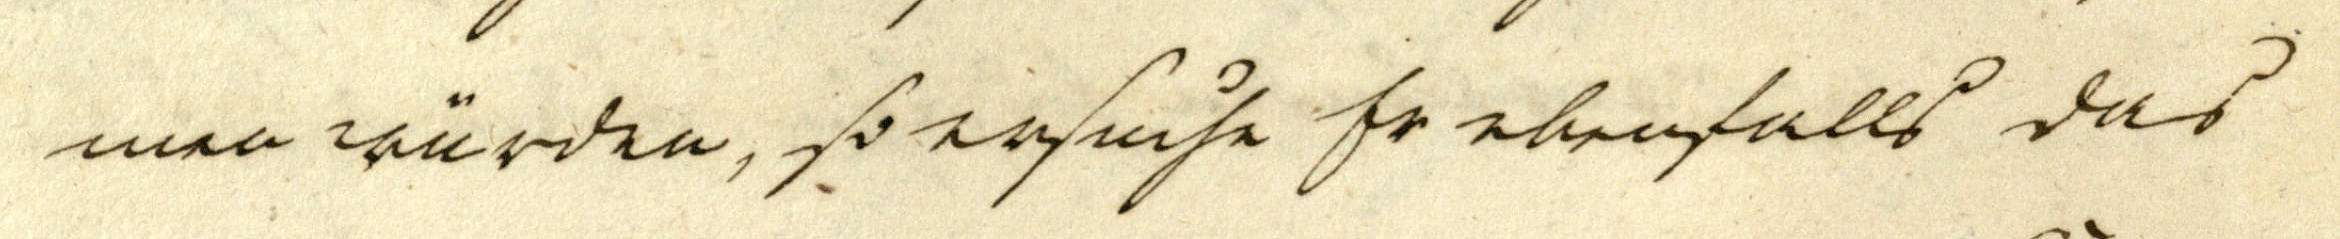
men würden, so ersuche Er ebenfalls das
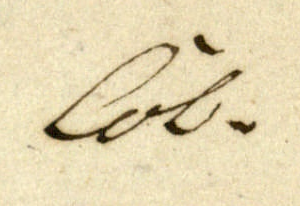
Col.
